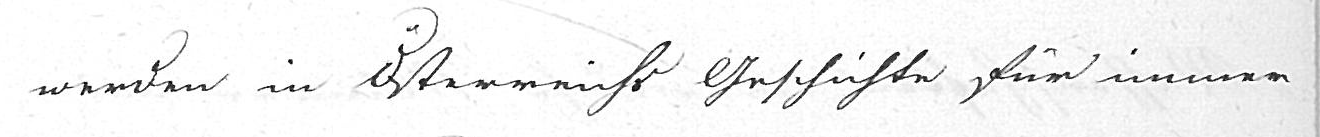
werden in Österreichs Geschichte für immer
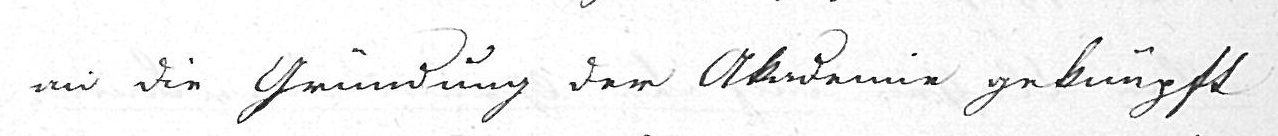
an die Gründung der Akademie geknüpft
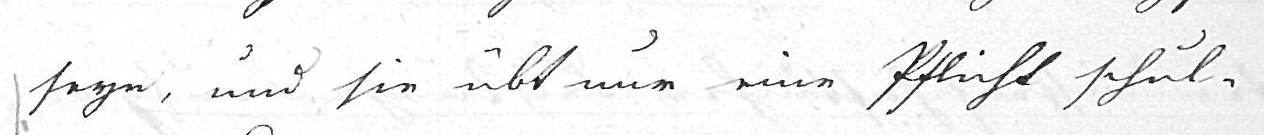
seyn, und sie übt nur eine Pflicht schul-
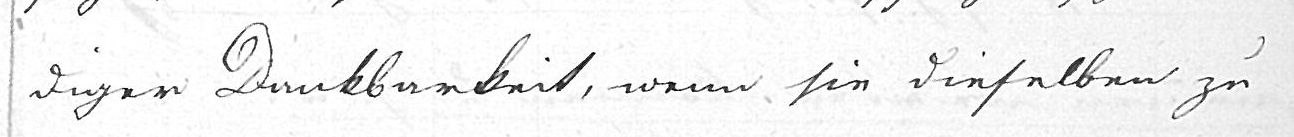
diger Dankbarkeit, wenn sie dieselben zu
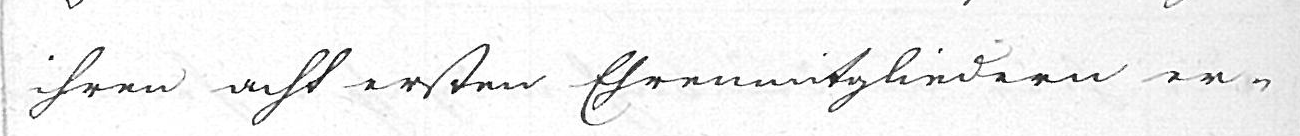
ihren acht ersten Ehrenmitgliedern er-
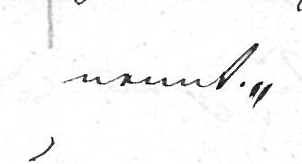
nennt."
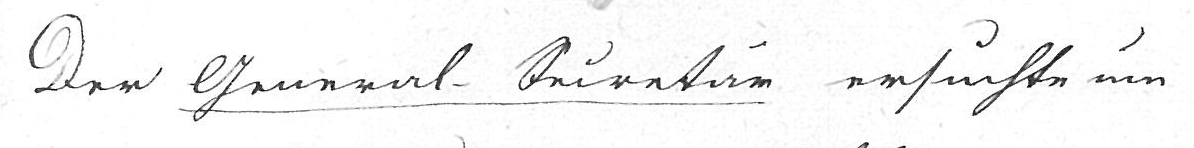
Der General-Secretär ersucht um
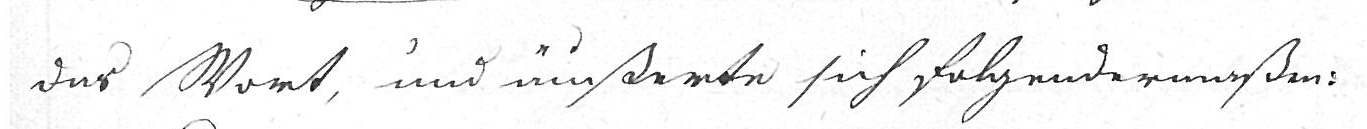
das Wort, und äußerte sich folgendermaßen:
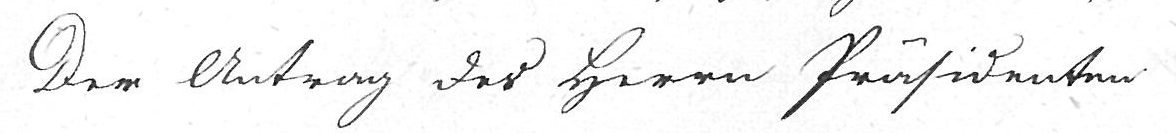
Der Antrag des Herrn Präsidenten
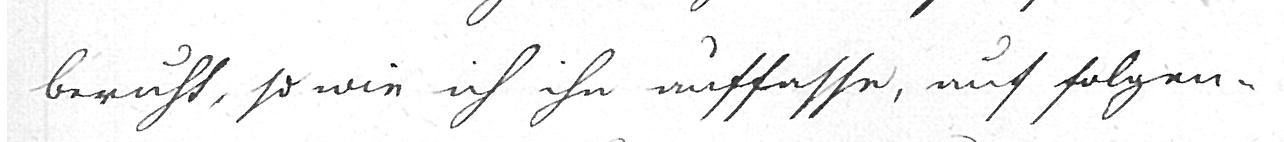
beruht, so wie ich ihn auffasse, auf folgen.
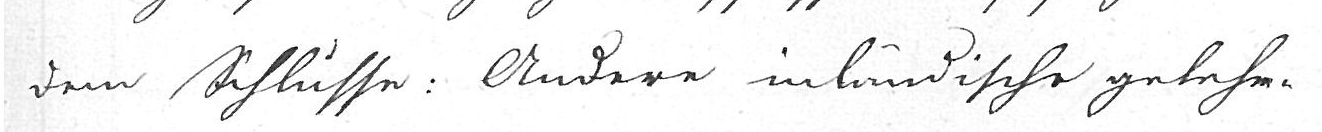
dem Schlusse: Andere inländische gelehr-
